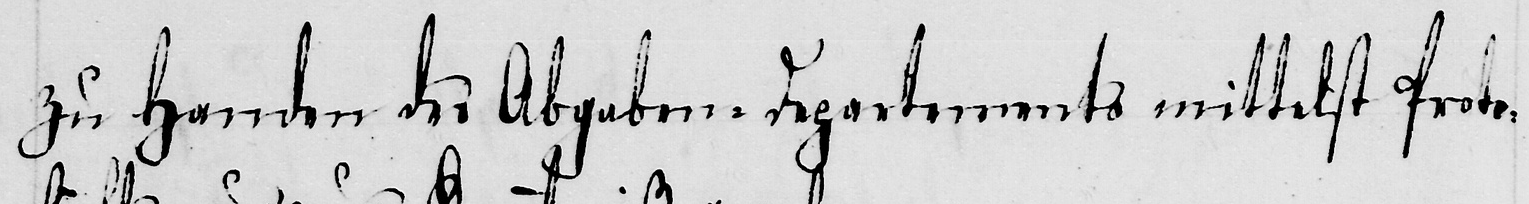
zu Handen des Abgaben-Departements mittelst Prot¬
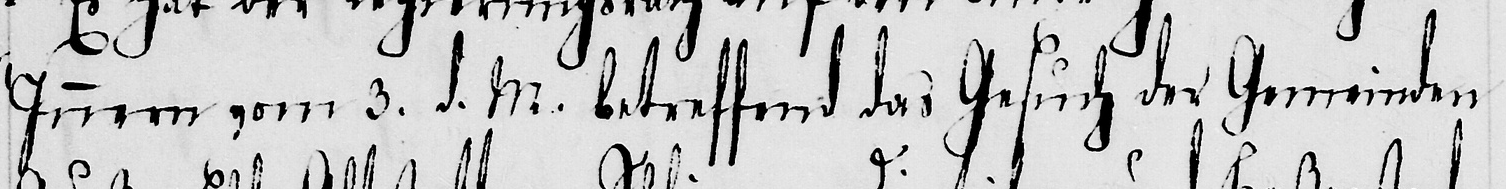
Innern vom 3. d. M. betreffend das Gesuch der Gemeinden
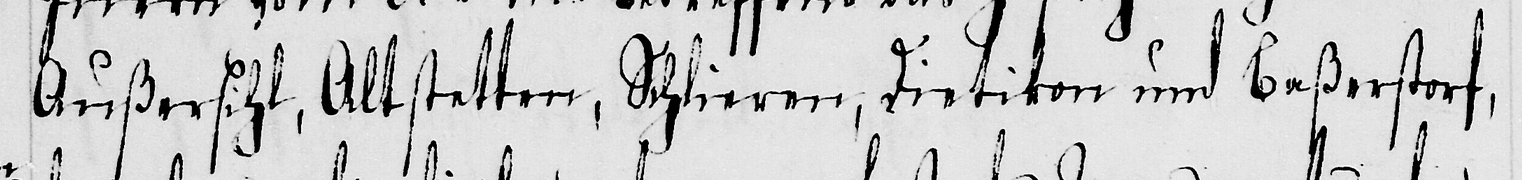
Außersihl, Altstetten, Schlieren, Dietikon und Baßerstorf,
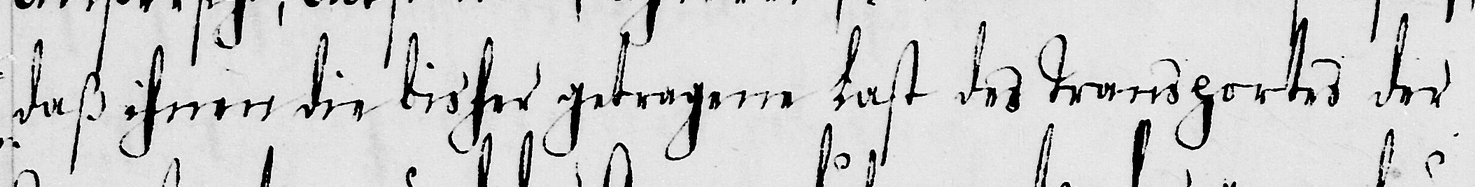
daß ihnen die bisher getragene Last des Transportes der
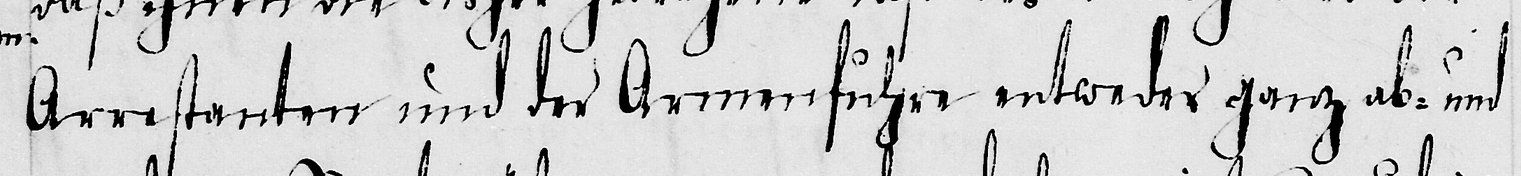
Arrestanten und der Armenfuhre entweder ganz ab- und
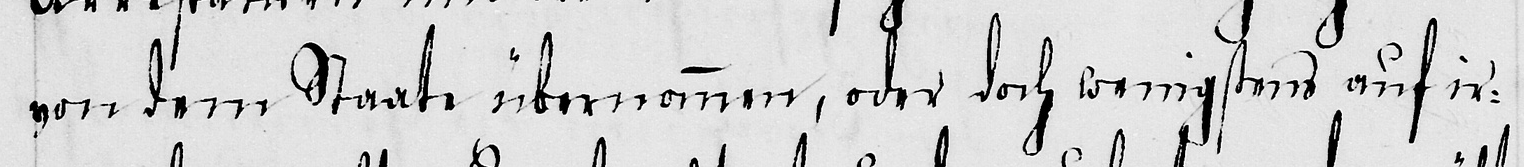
von dem Staate übernommen, oder doch wenigstens auf ir¬
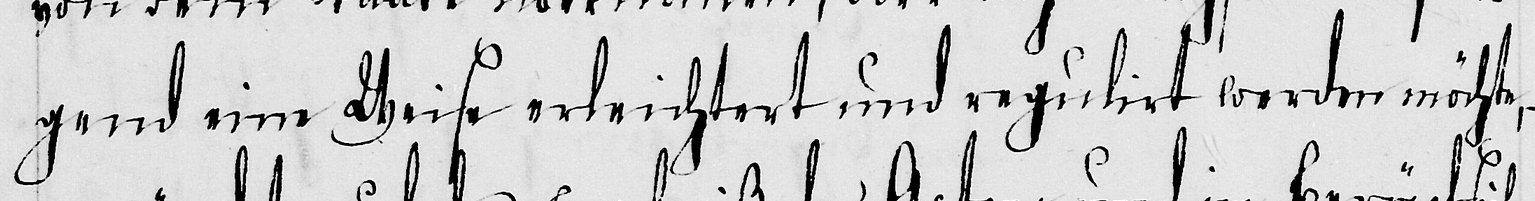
gend eine Weise erleichtert und regulirt werden möcht¬
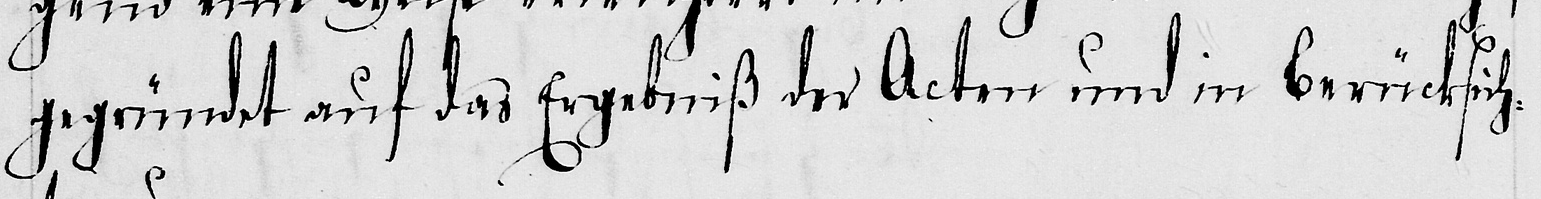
gegründet auf das Ergebniß der Acten und in Berücksic¬
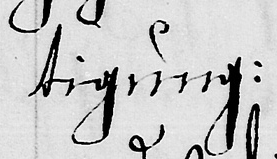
htigung:
